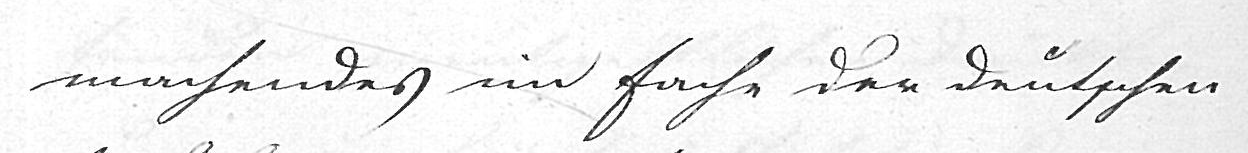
machendes im Fache der deutschen
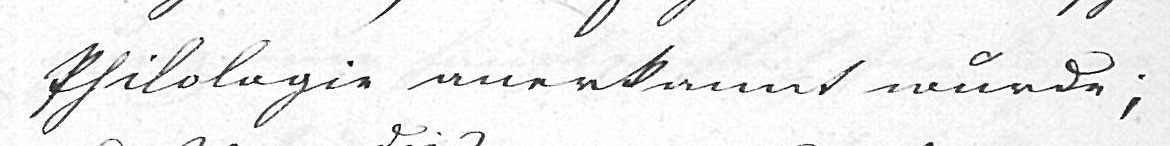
Philologie anerkannt wurde;
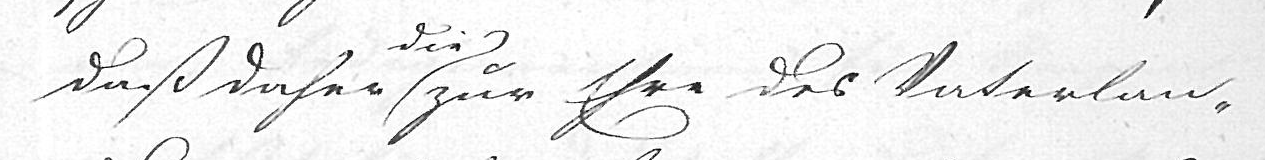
daß daher die zur Ehre des Vaterlan-
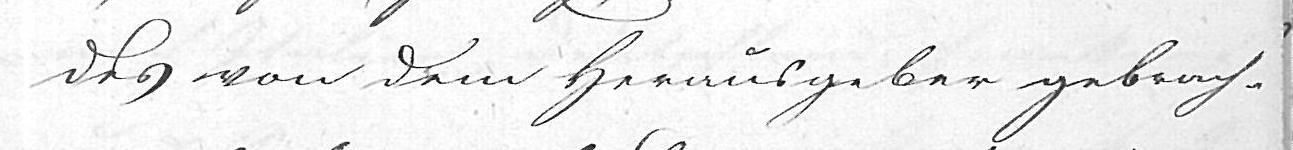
des von dem Herausgeber gebrach-
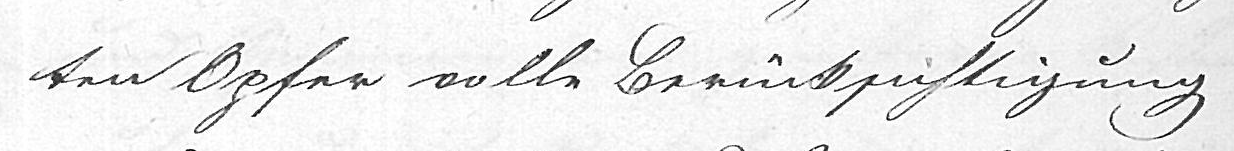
ten Opfer volle Berücksichtigung
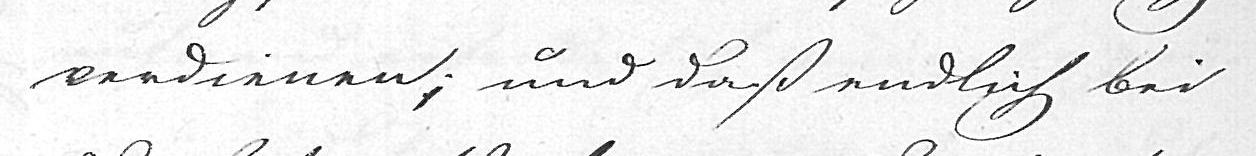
verdienen; und daß endlich bei
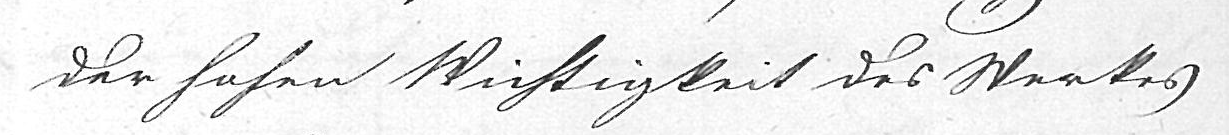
der hohen Wichtigkeit des Werkes
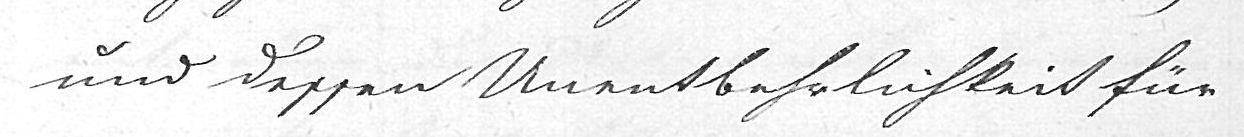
und dessen Unentbehrlichkeit für
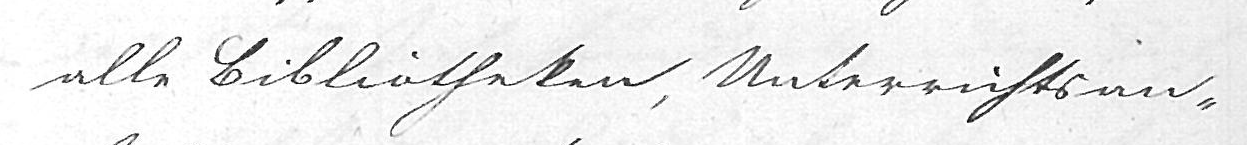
alle Bibliotheken, Unterrichtsan-
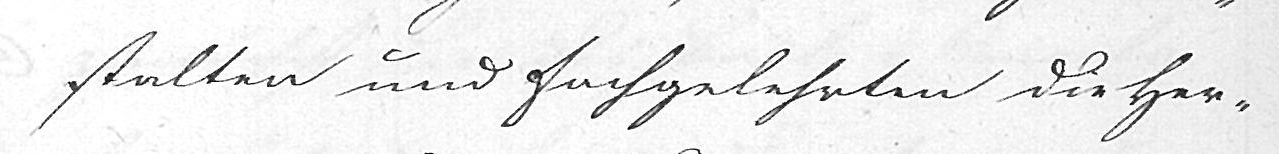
stalten und Fachgelehrten die Her-
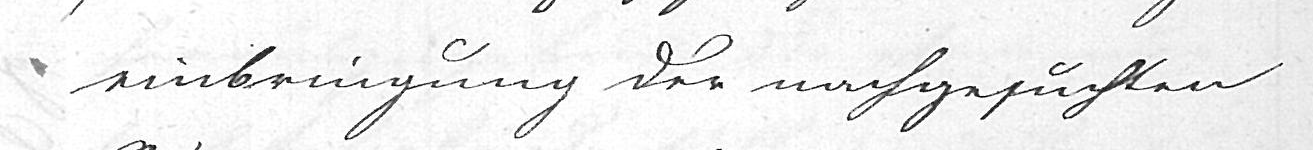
einbringung der nachgesuchten
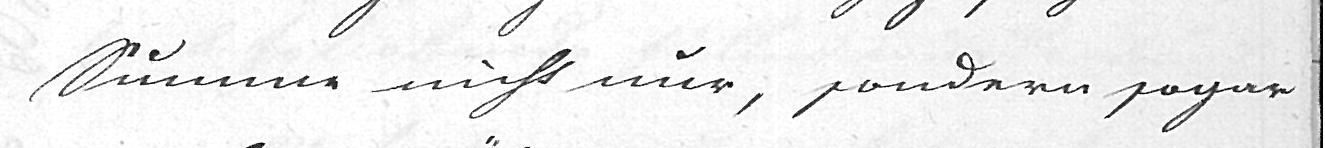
Summe nicht nur, sondern sogar
